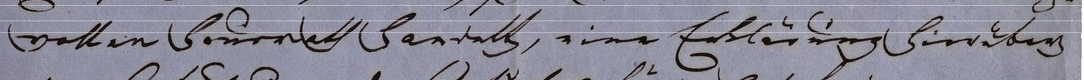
vollen Hausrath handelt, eine Erklärung hierüber
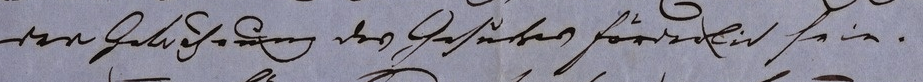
der Gewährung des Gesuches förderlich sein.
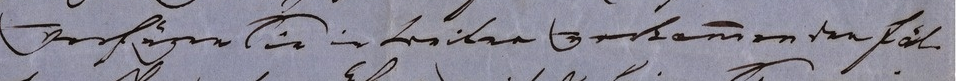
Verfügen Sie in weiter vorkommenden Fäl-
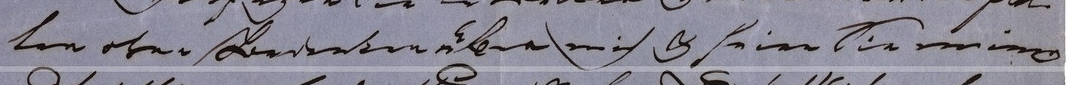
len ohne Bedenken über mich & seien Sie meiner
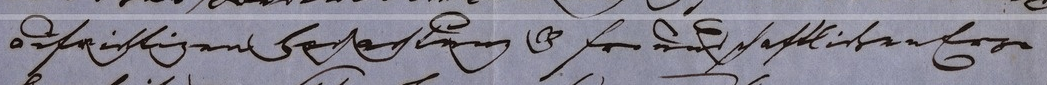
aufrichtigen Hochachtung & freundschaftlichen Erge-
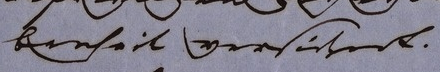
benheit versichert.
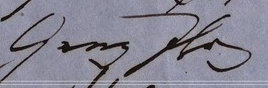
Ganz Ihr
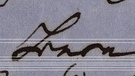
Bern
